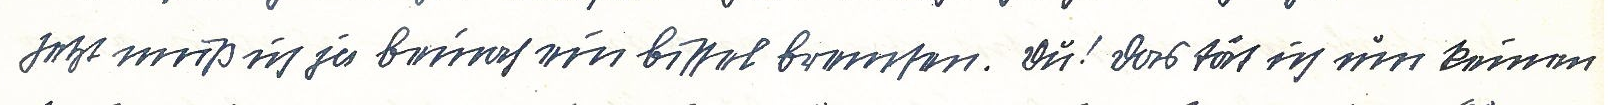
Jetzt muß ich ja beinah ein bissel bremsen. Du! Das tät ich um keinen
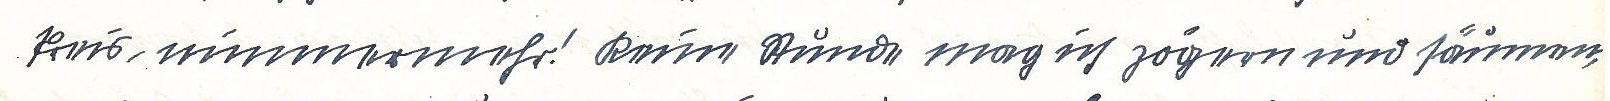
Preis, nimmermehr! Keine Stunde mag ich zögern und säumen,
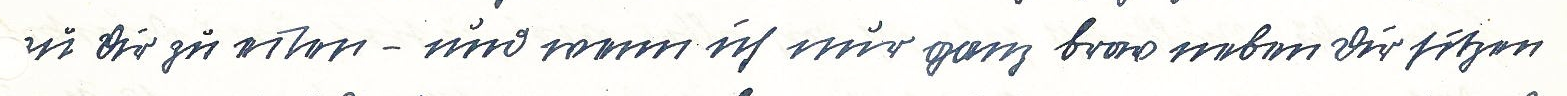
zu Dir zu eilen – und wenn ich nur ganz brav neben Dir sitzen
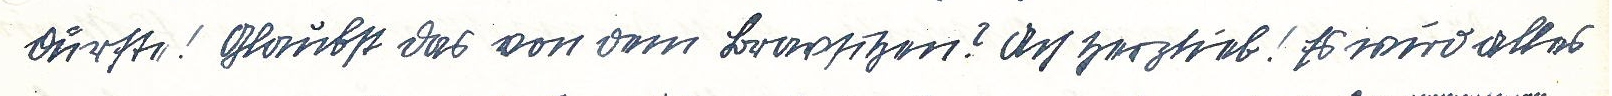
dürfte! Glaubst das von dem Bravsitzen? Ach Herzlieb! Es wird alles
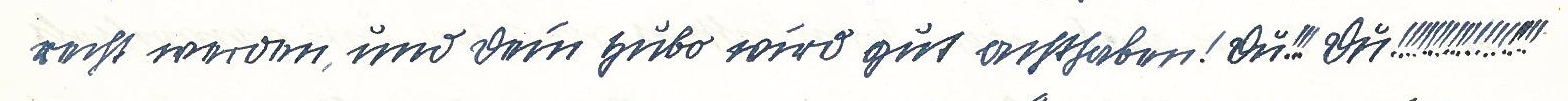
recht werden, und Dein Hubo wird gut achtgeben! Du!!! Du!!!!!!!!!!!!!!!!!!
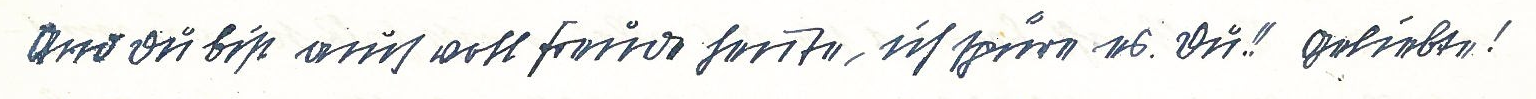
Und Du bist auch voll Freude heute, ich spüre es. Du!! Geliebte!
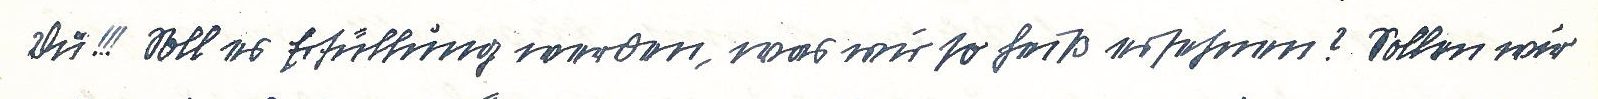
Du!!! Soll es Erfüllung werden, was wir so heiß ersehnen? Sollen wir
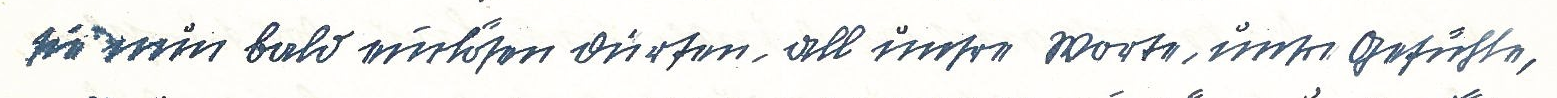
sie nun bald einlösen dürfen, all unsre Worte, unsre Gefühle,
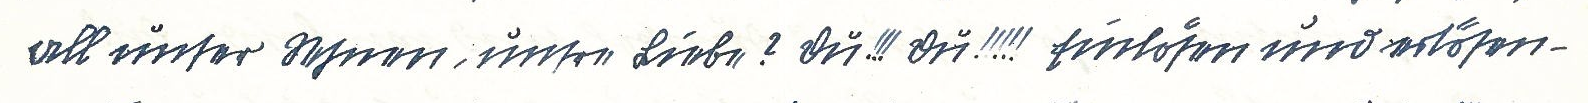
all unser Sehnen, unsre Liebe? Du!!! Du!!!!! Einlösen und erlösen –
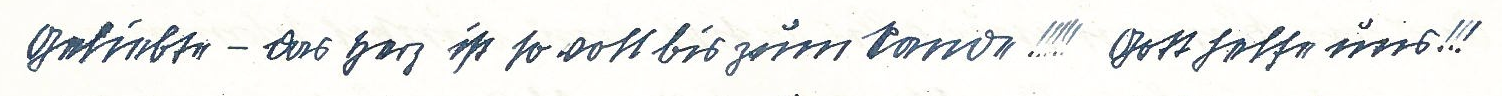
Geliebte – das Herz ist so voll bis zum Rande!!!!! Gott helfe uns!!!
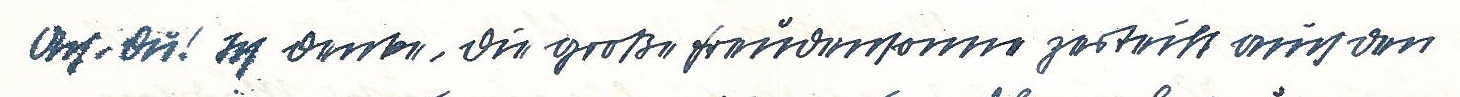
Ach, Du! Ich denke, die große Freudensonne zerteilt auch den
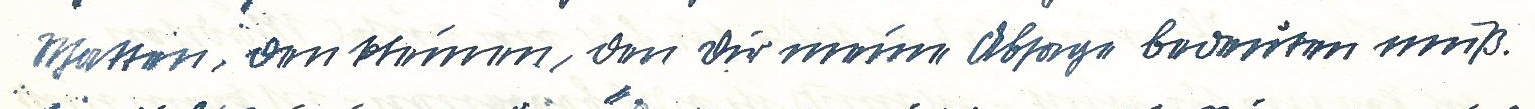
Schatten, den kleinen, den Dir meine Absage bedeuten muß.
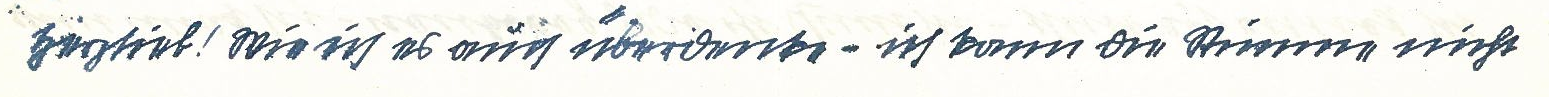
Herzlieb! Wie ich es auch überdenke – ich kann die Stimme nicht
